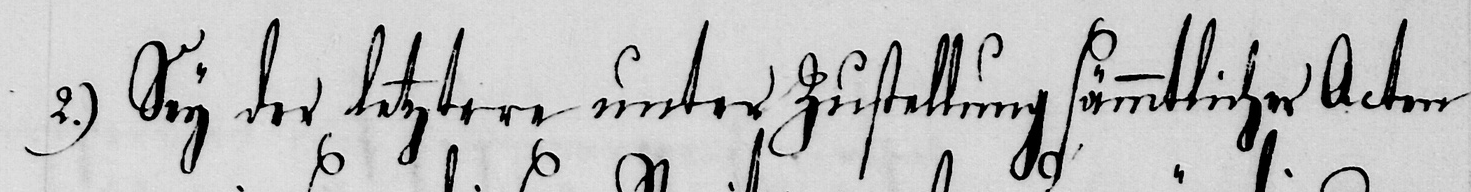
2.) Sey der letztere unter Zustellung sämmtlicher
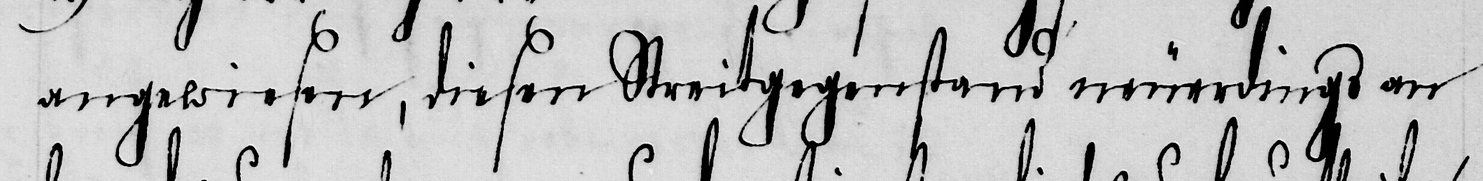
angewiesen, diesen Streitgegenstand neuerdings an
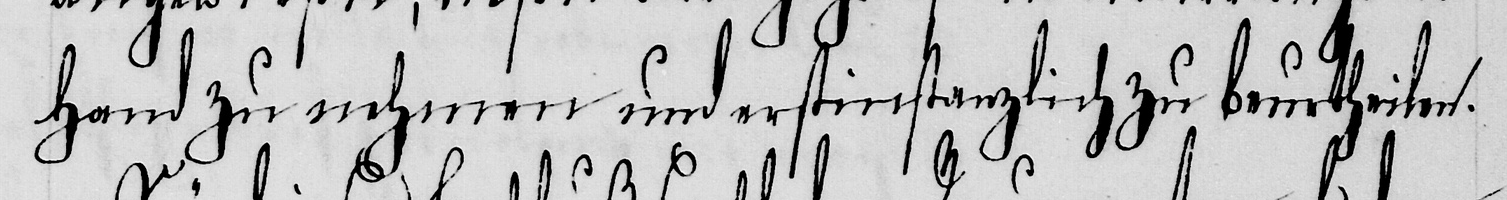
Hand zu nehmen und erstinstanzlich zu beurtheile¬
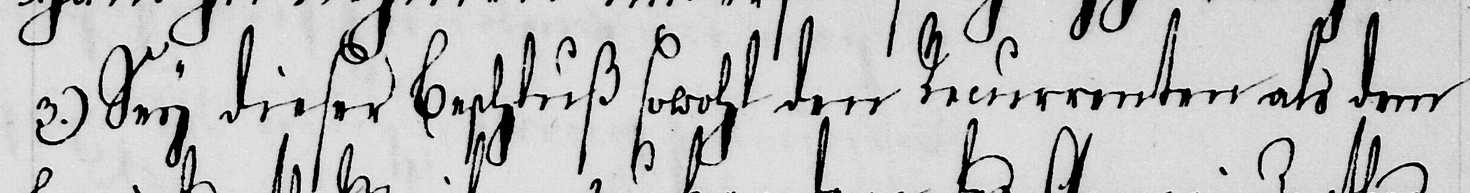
3.) Sey dieser Beschluß sowohl den Recurrenten als dem
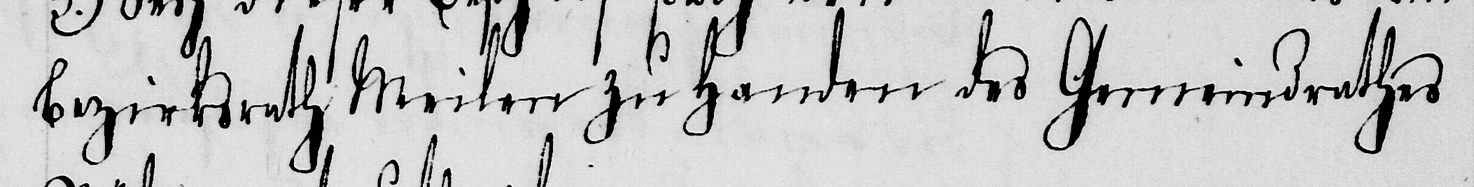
Bezirksrath Meilen zu Handen des Gemeindrathes
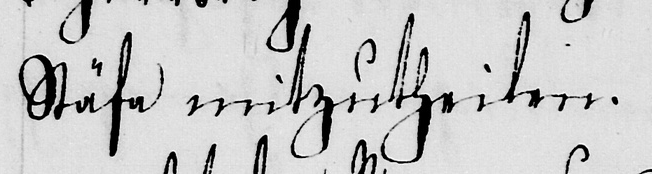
Stäfa mitzutheilen.
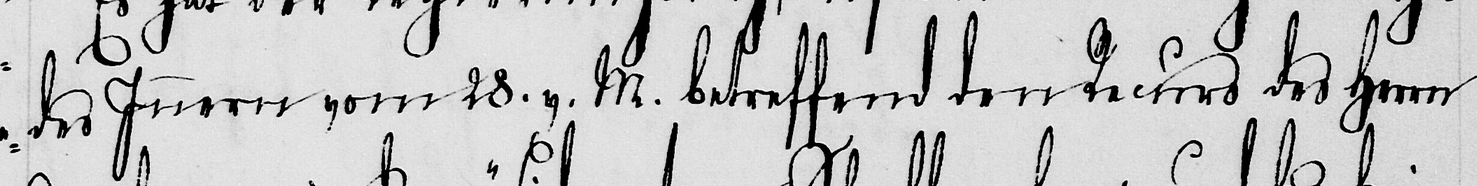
des Innern vom 28. v. M. betreffend den Recurs des Herrn
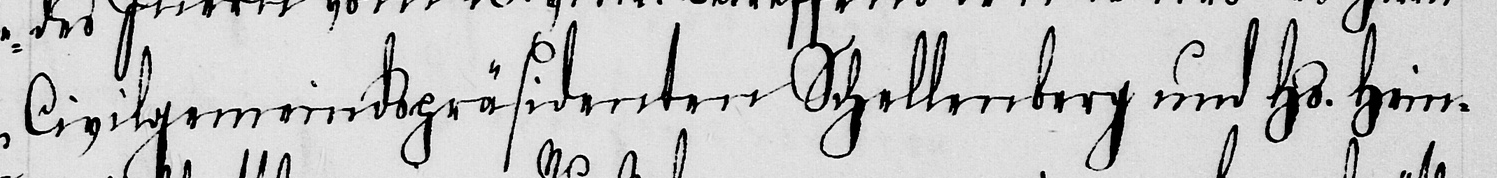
Civilgemeindspräsidenten Schellenberg und Hs. Hein¬
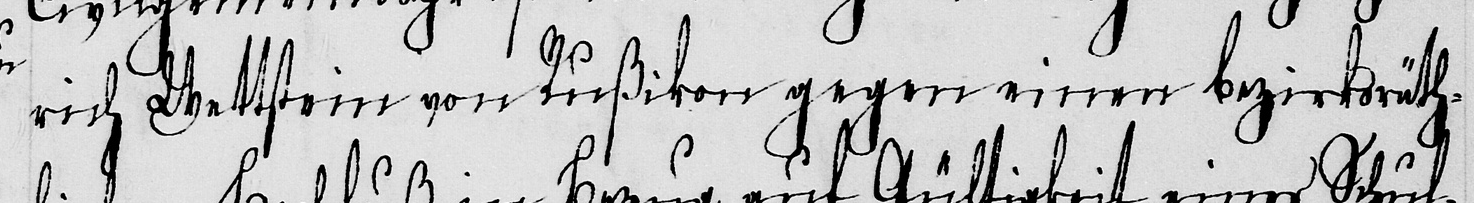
rich Wettstein von Rußikon gegen einen bezirksräth¬
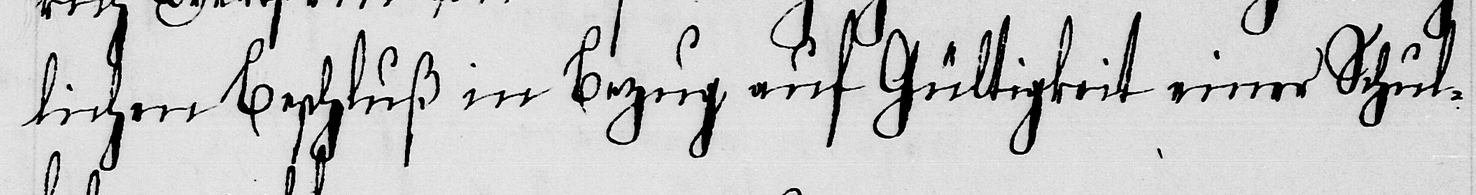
lichen Beschluß in Bezug auf Gültigkeit einer Schul¬
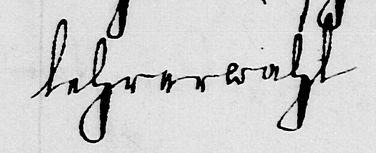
lehrerwahl
